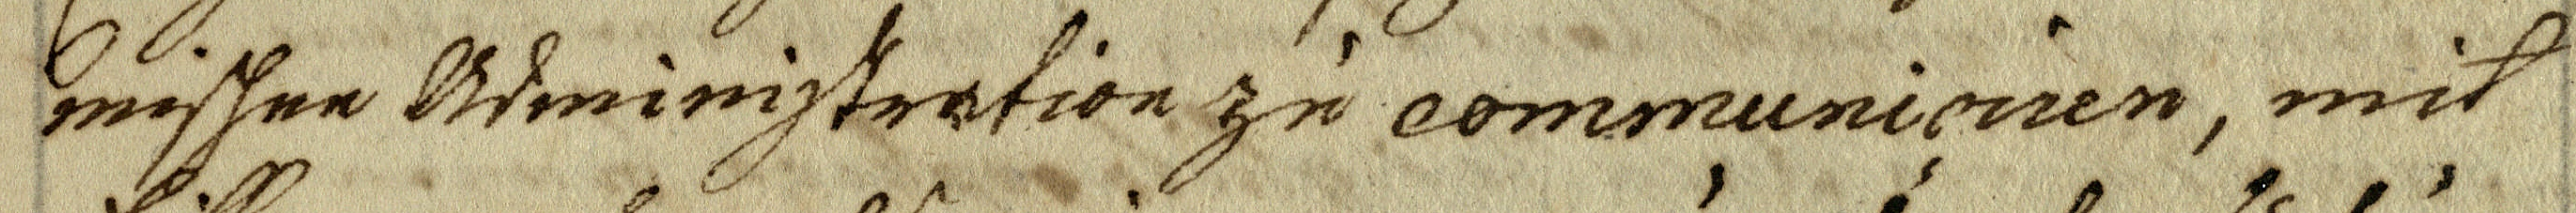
mischen Administration zu communiciren, mit
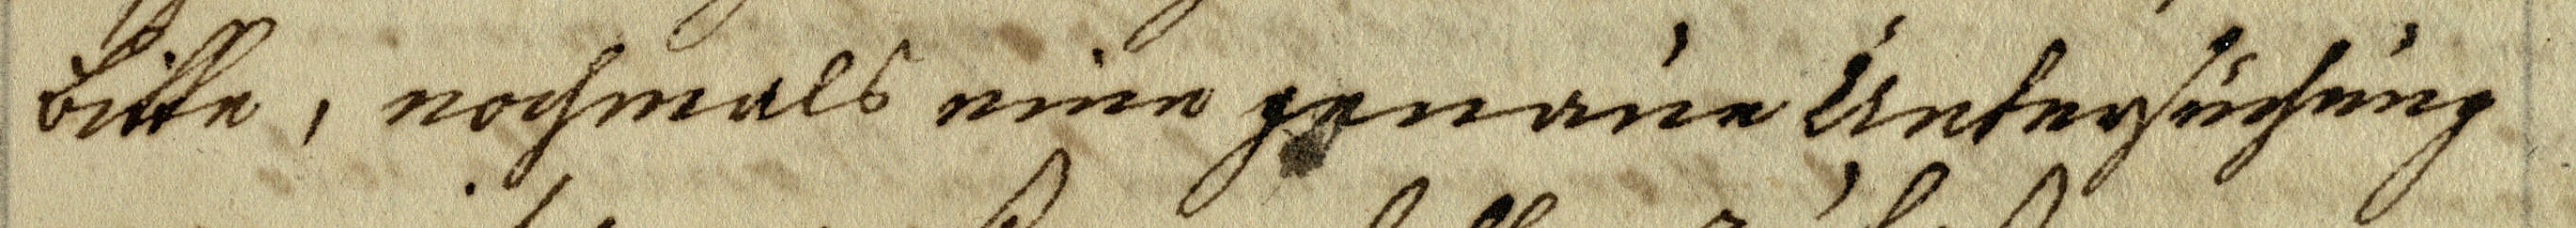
Bitte, nochmals eine genaue Untersuchung
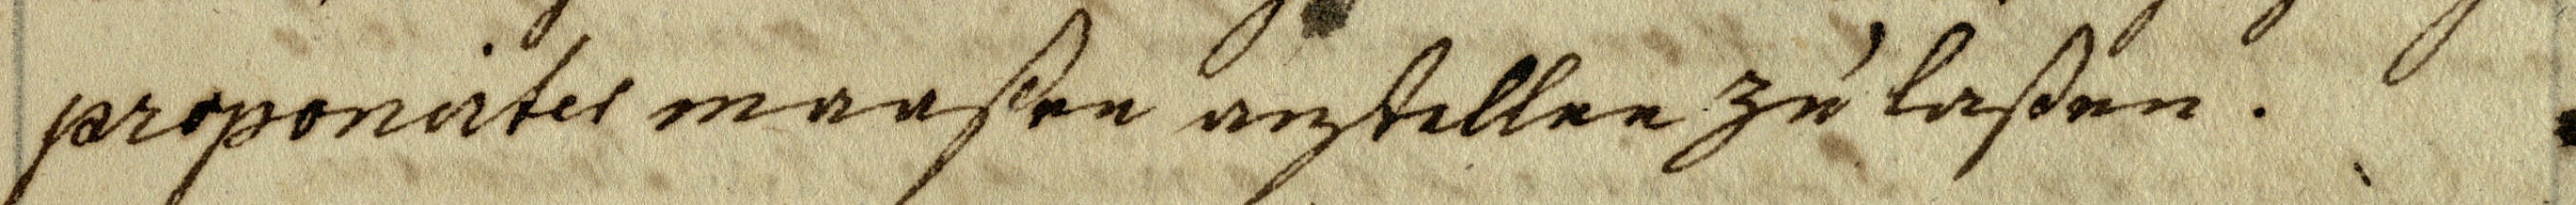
proponirter maaßen anstellen zu laßen.
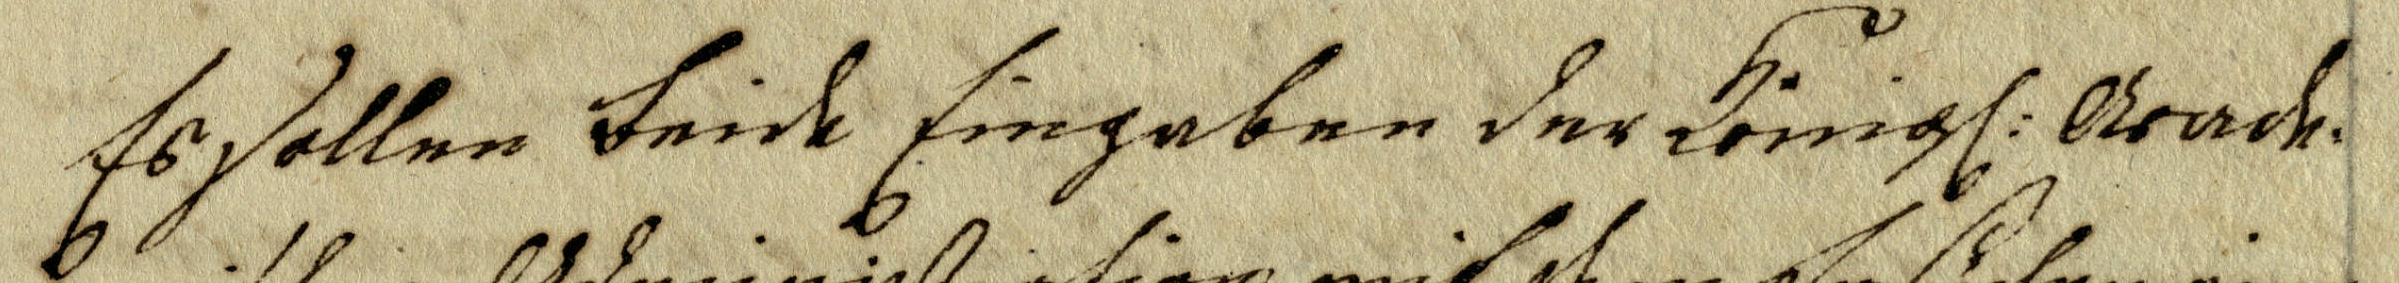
Es sollen beide Eingaben der Königl. Acade¬
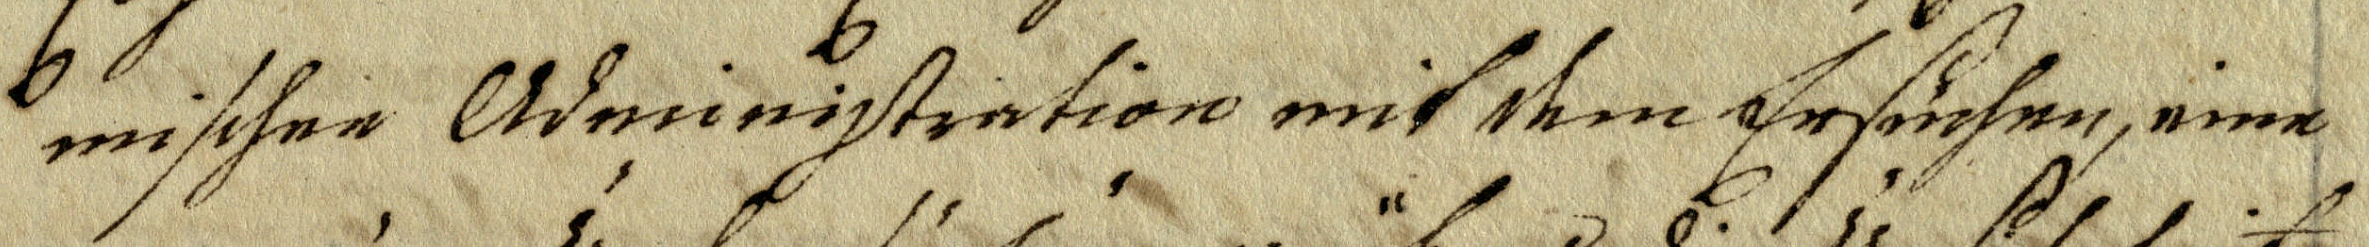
mischen Administration mit dem Ersuchen, eine
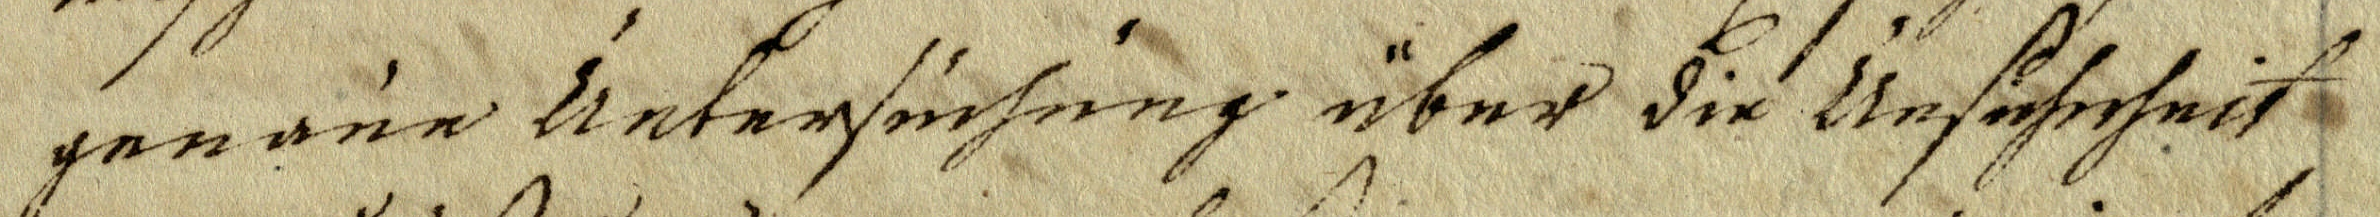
genaue Untersuchung über die Unsicherheit
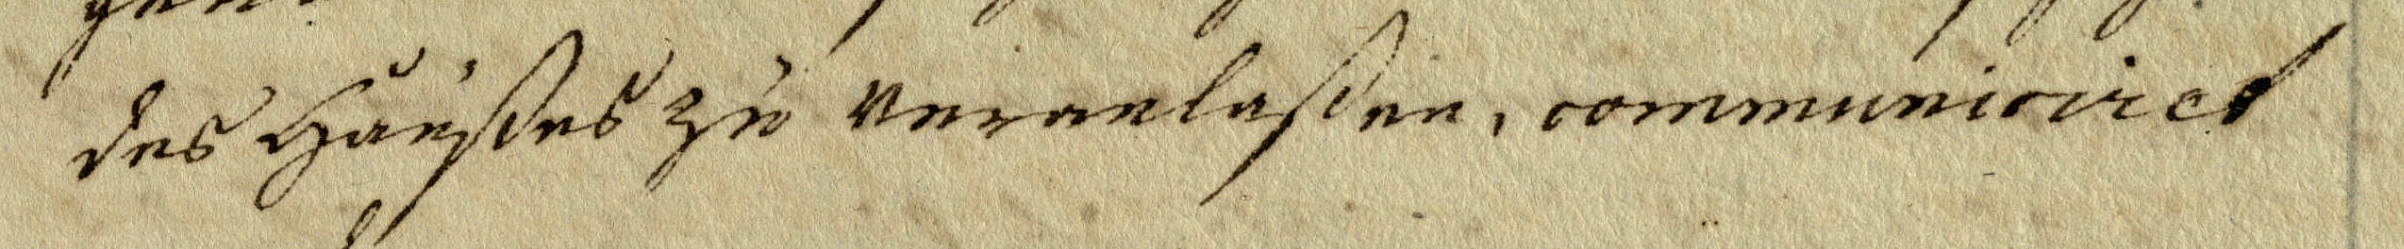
des Haußes zu veranlaßen, communiciret
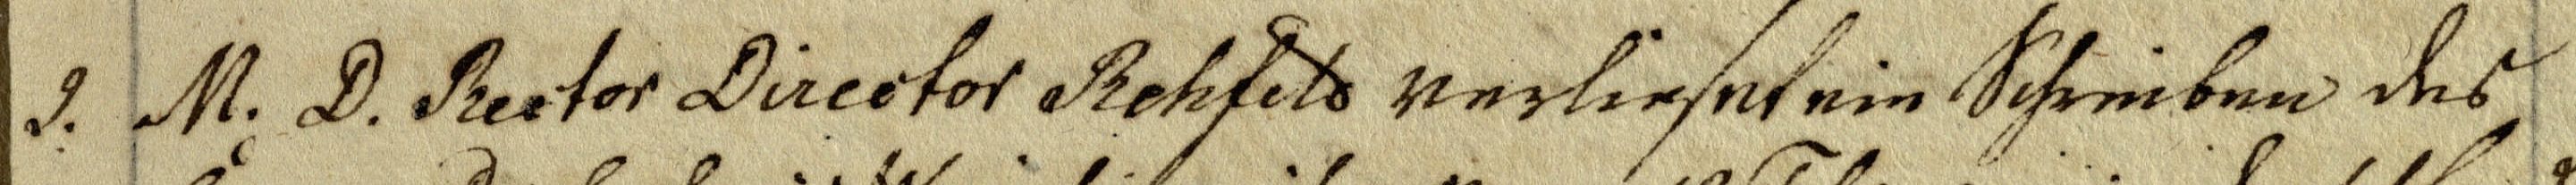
2. M. D. Rector Director Rehfeld verleiset ein Schreiben des
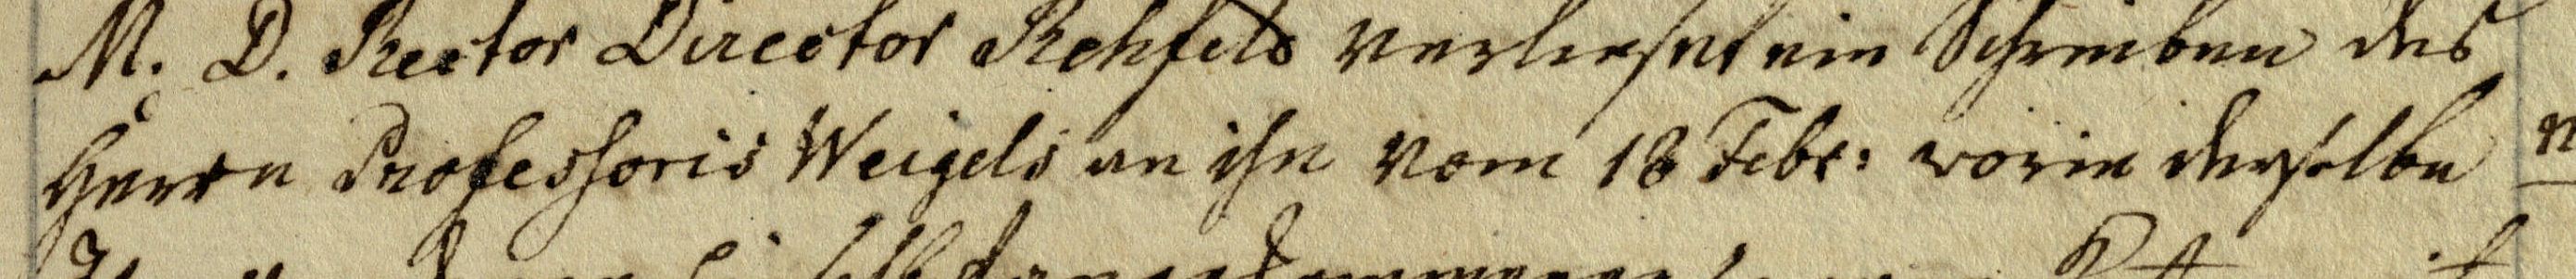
Herrn Professoris Weigels an ihn vom 18 Febr. worin derselbe
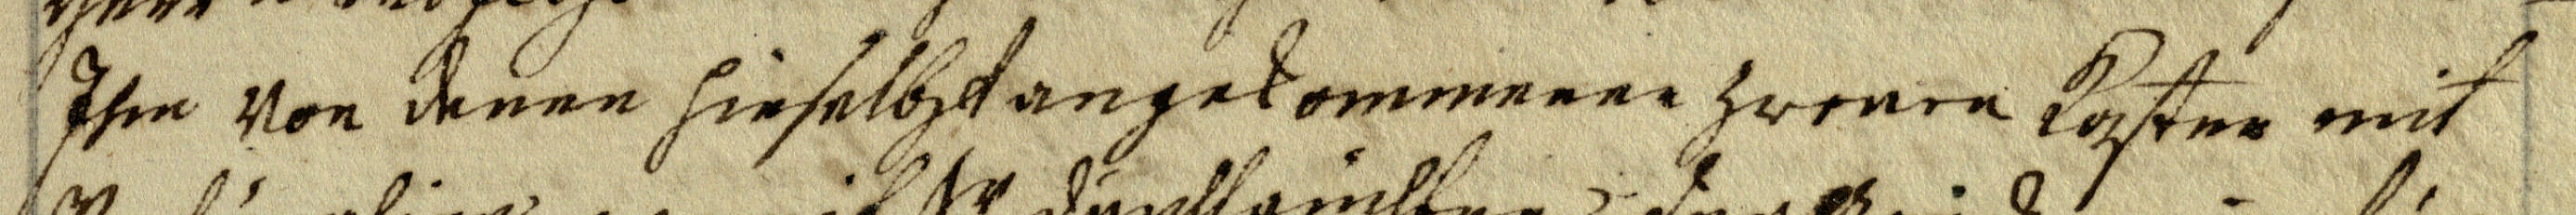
Ihm von denen hieselbt angekommenen zweene Kasten mit
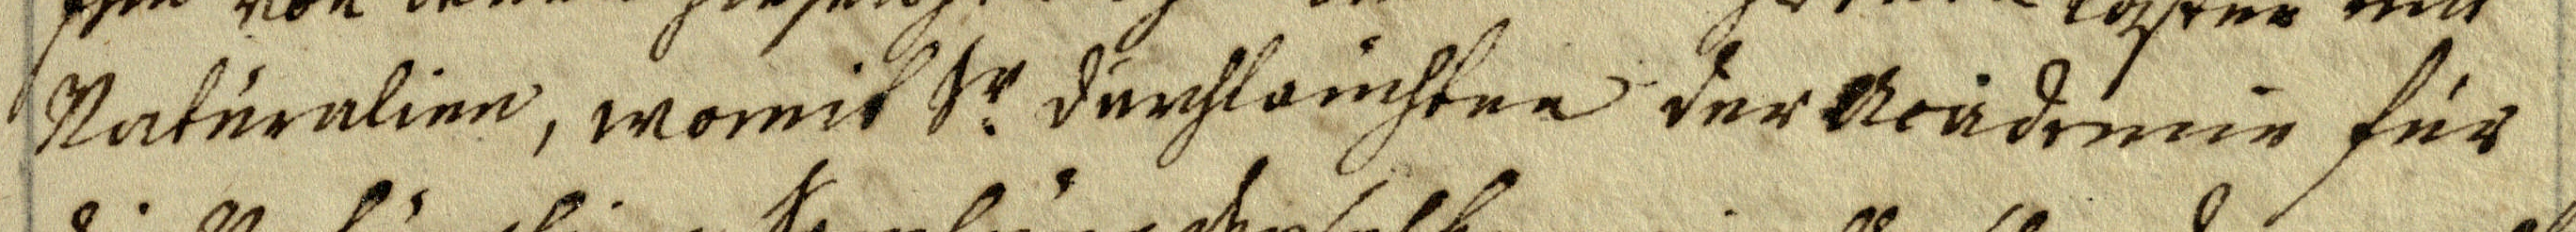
Naturalien, womit Sr. Durchlauchten der Academie für
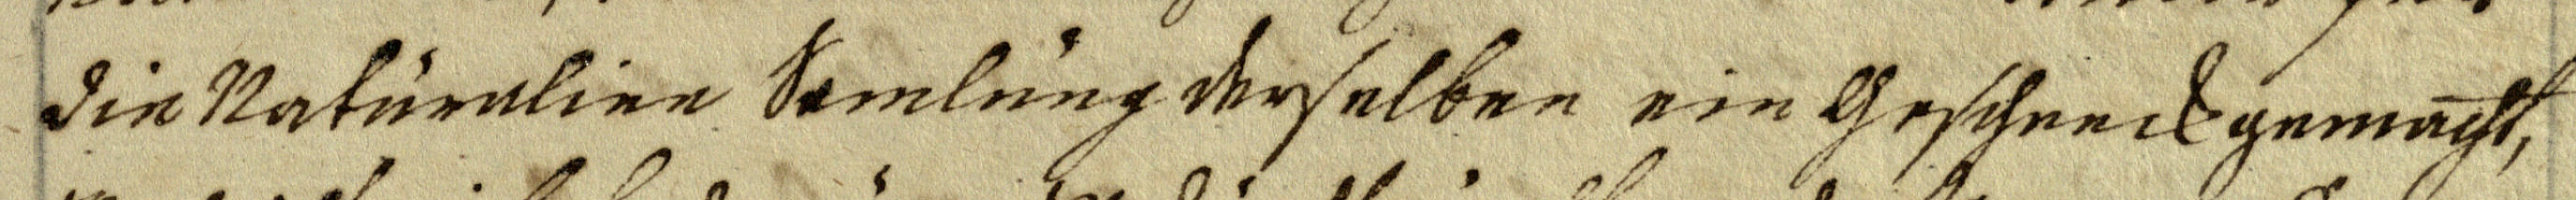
die Naturalien Samlung derselben ein Geschenk gemacht,
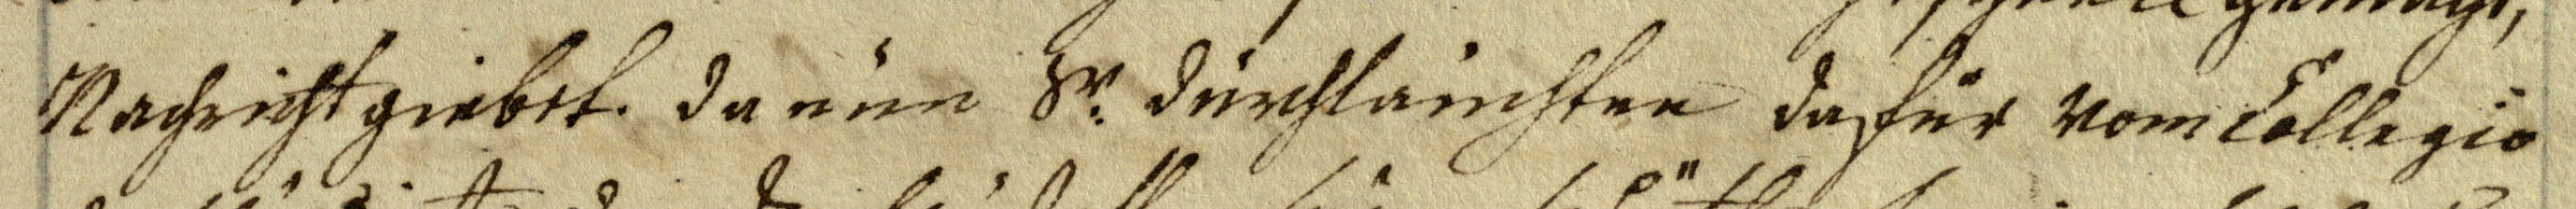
Nachricht giebet. Da nun Sr. Durchlauchten dafür vom Collegio
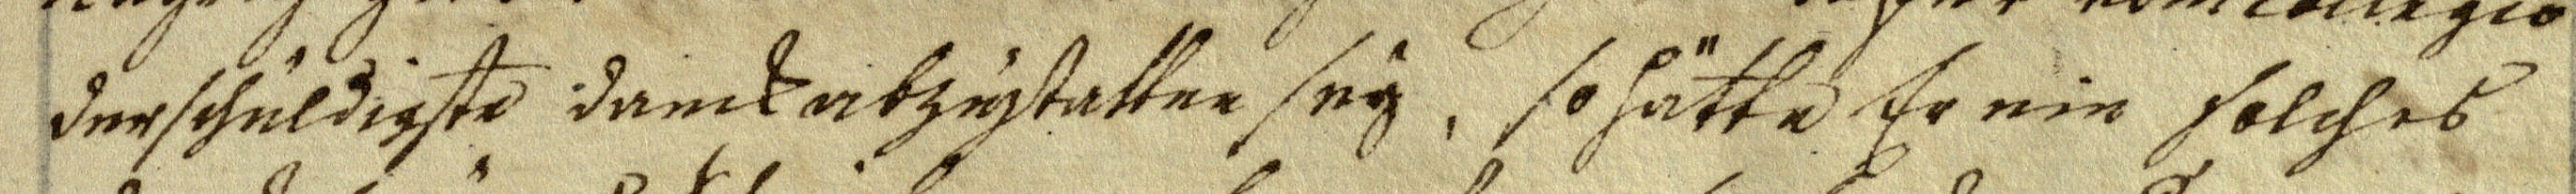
der schuldigste Dank abzustatten seÿ, so hätte Er ein solches
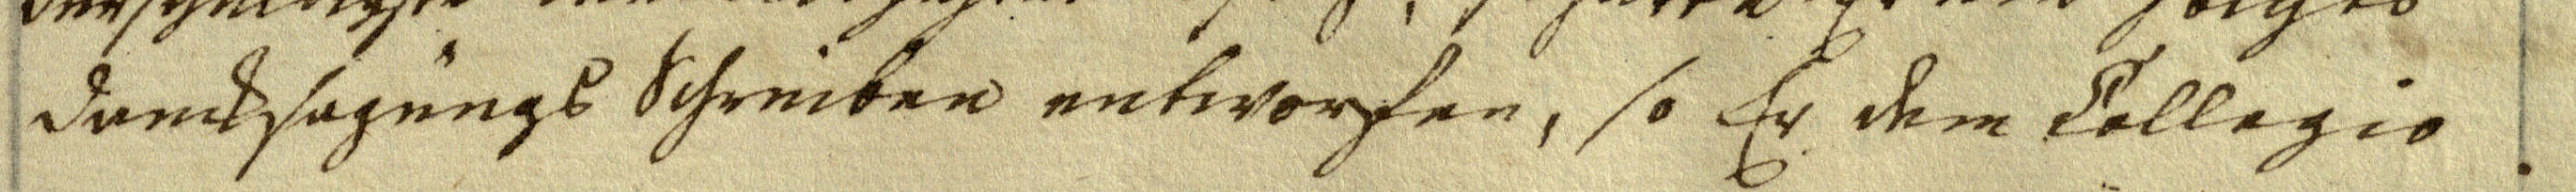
Danksagungs Schreiben entworfen, so Er dem Collegio
